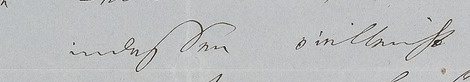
indessen vielleicht
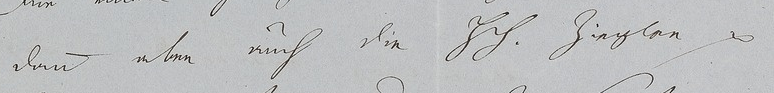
dann eben auch die HH. Ziegler &
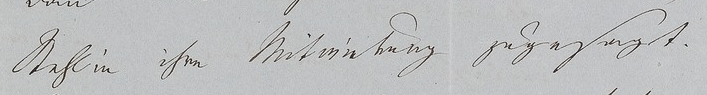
Stehlin ihre Mitwirkung zugesagt.
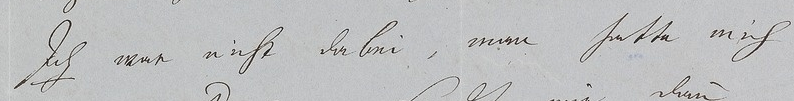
Ich war nicht dabei, man hatte mich
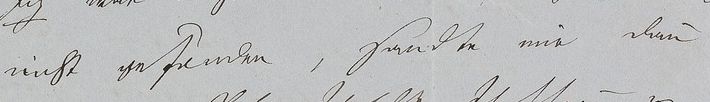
nicht gefunden, sandte mir dann
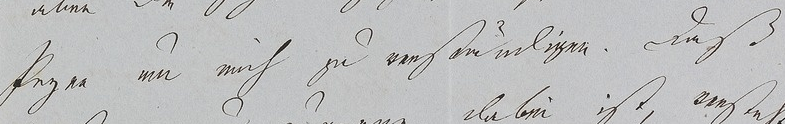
Peyer um mich zu verständigen. Daß
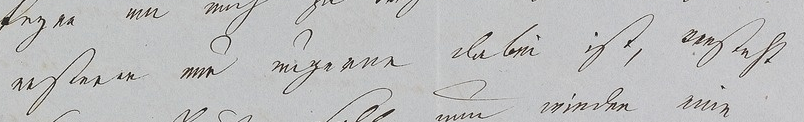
ersterer nur ungerne dabei ist, versteht
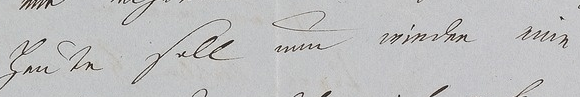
Heute soll nun wieder eine
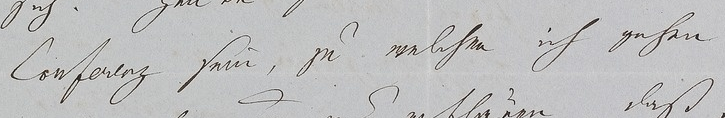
Conferenz sein, zu welcher ich gehen
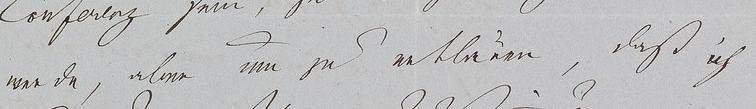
werde, aber um zu erklären, daß ich
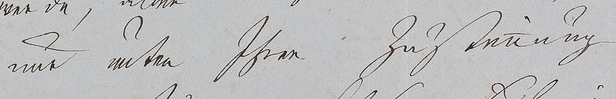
nur unter Ihrer Zustimmung
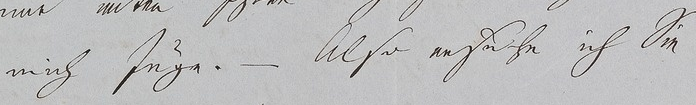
mich füge. – Also ersuche ich Sie
